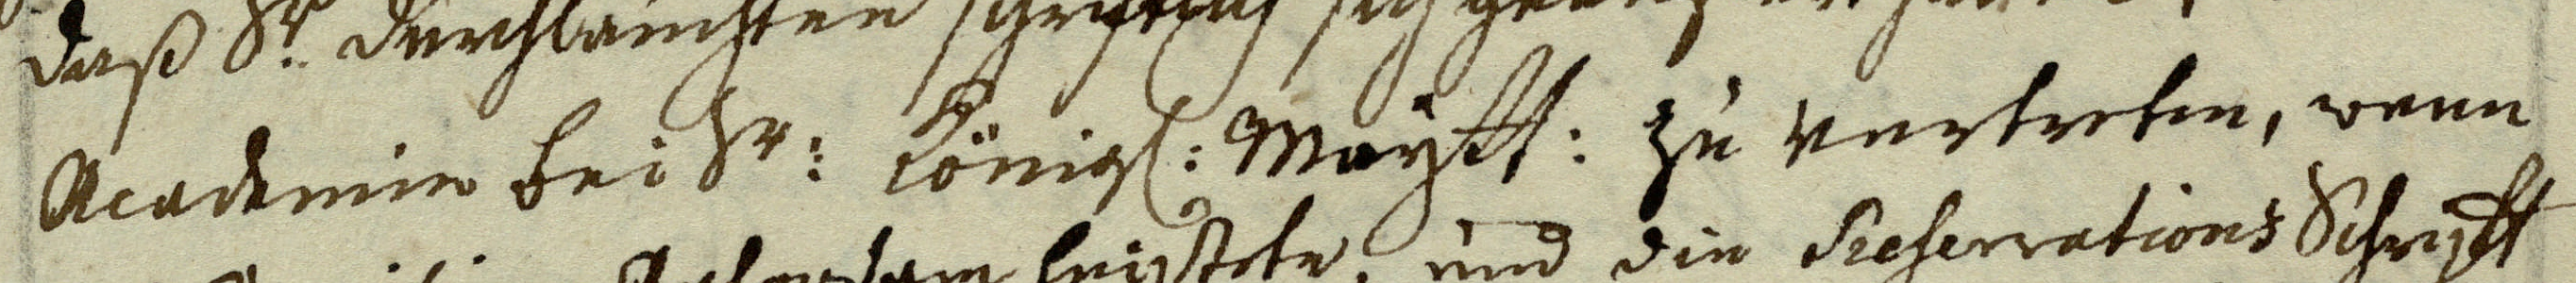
Academie bei Sr. Königl. Maÿtt. zu vertreten, wenn
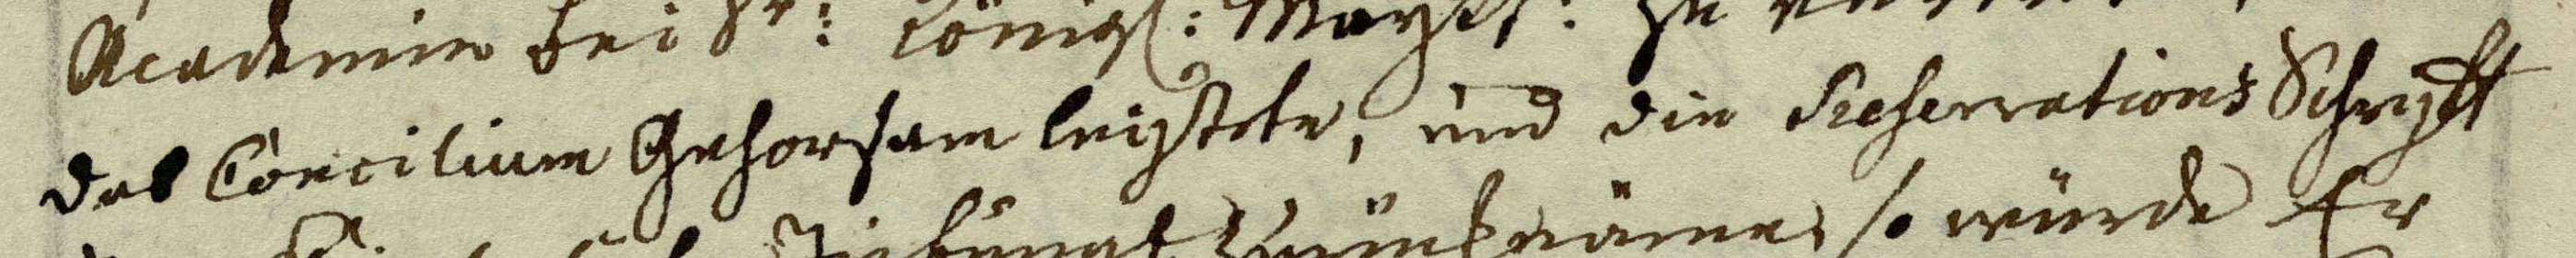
das Concilium Gehorsam leisten, und die Preservations Schrift
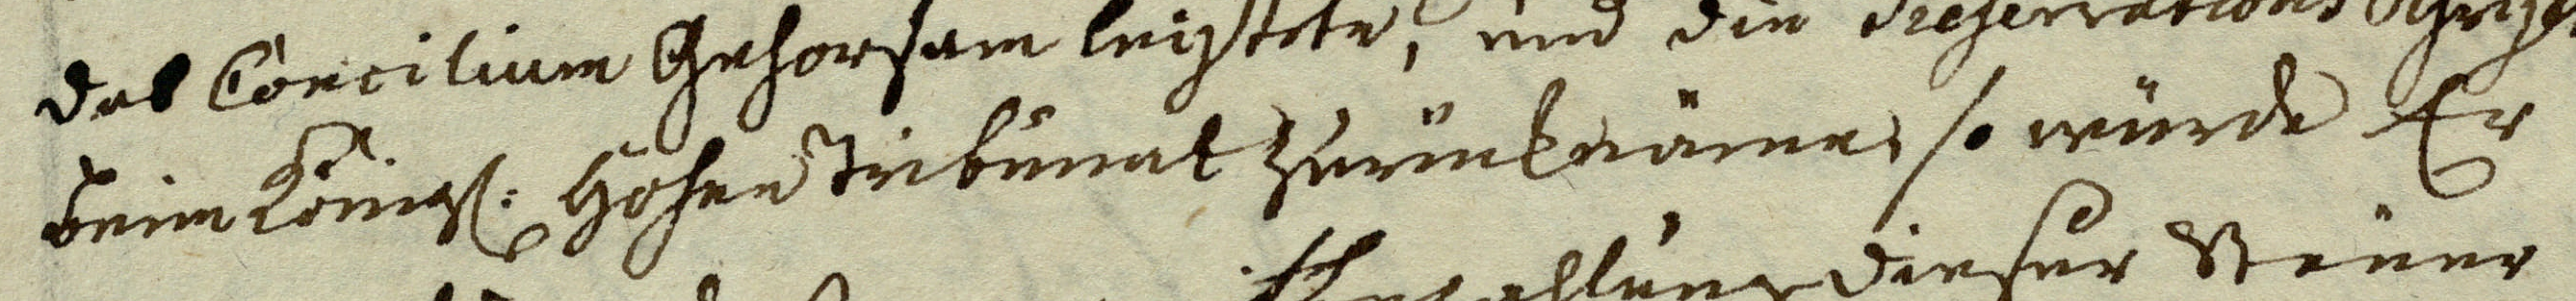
beim Königl. Hohen Tribunal zurück näme, so würde Er
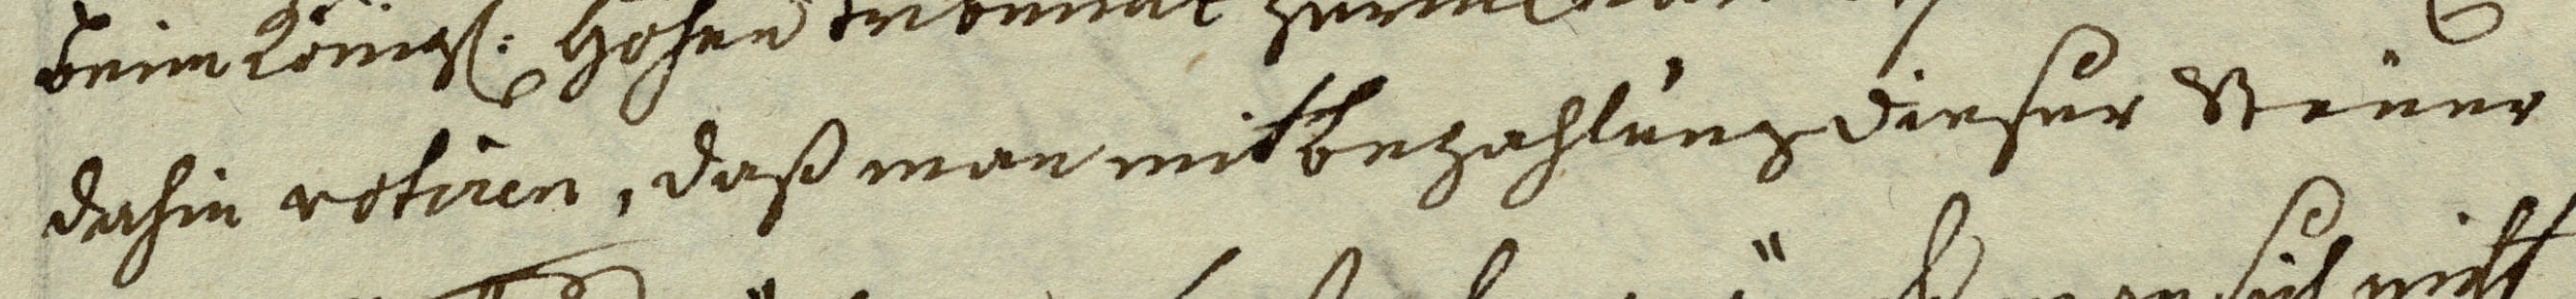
dahin votiren, daß man mit Bezahlung dieser Steuer
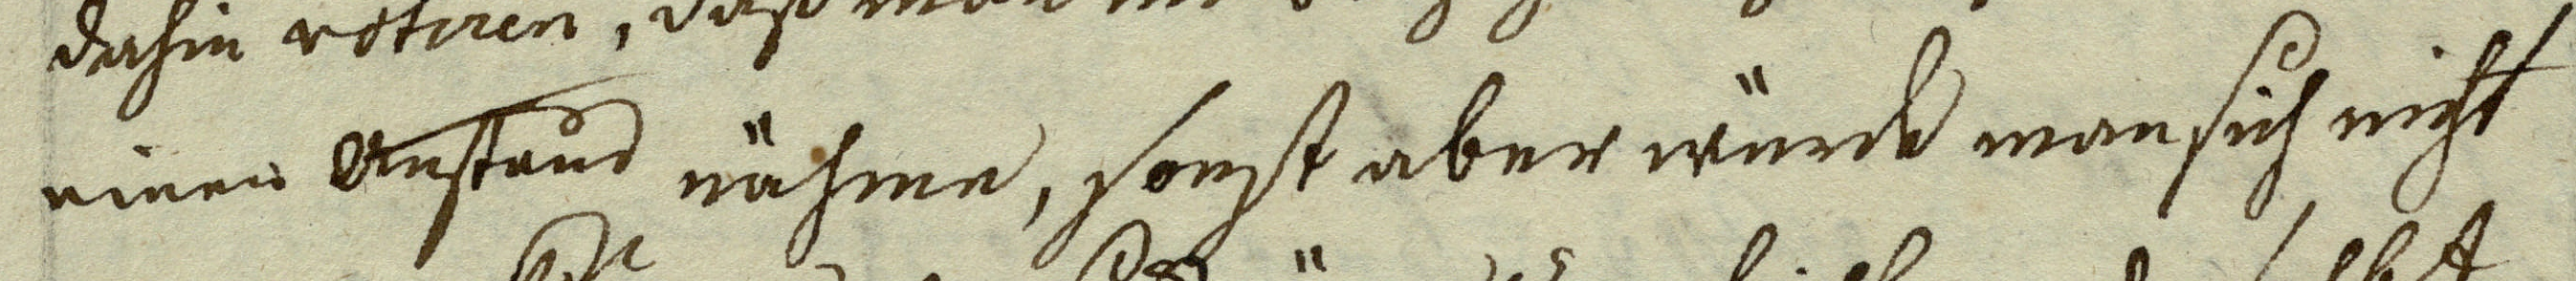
einen Anstand nähme, sonst aber würde man sich nicht
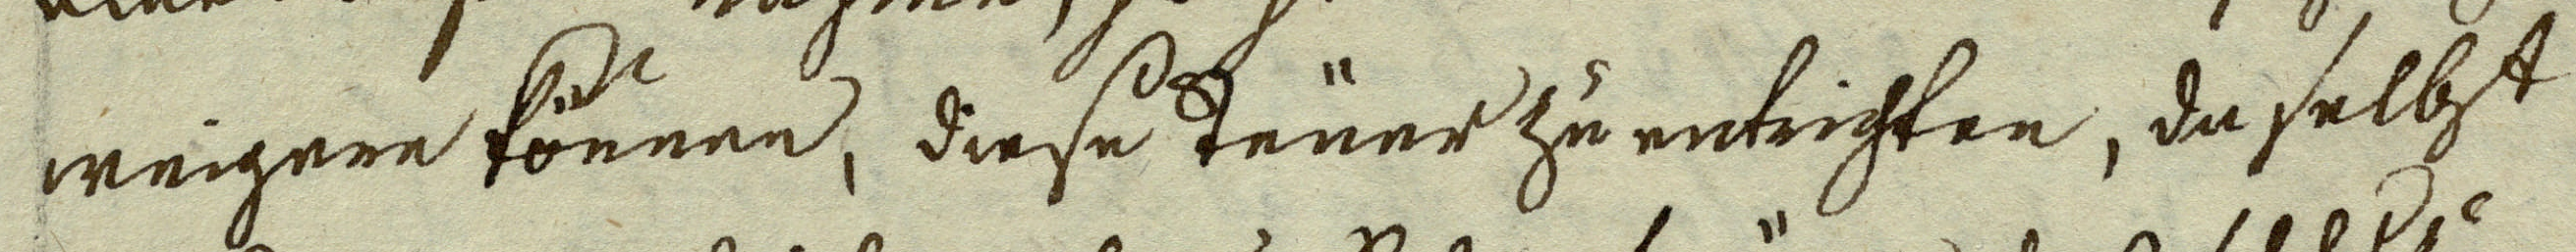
weigern können, diese Steuer zu entrichten, da selbst
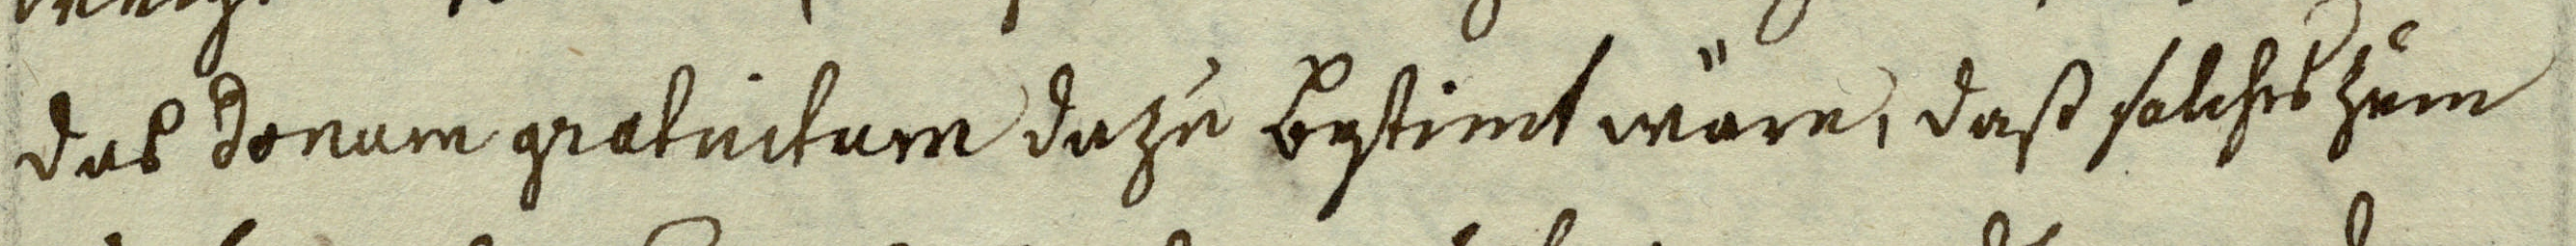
das donum gratuitum dazu bestimt wäre, daß solches zum
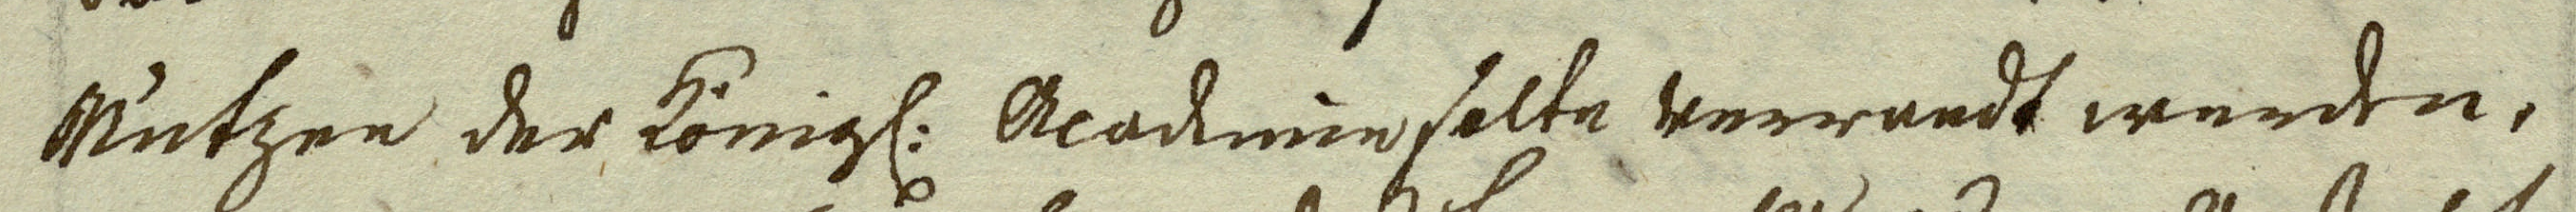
Nutzen der Königl. Academie solte verwandt werden,
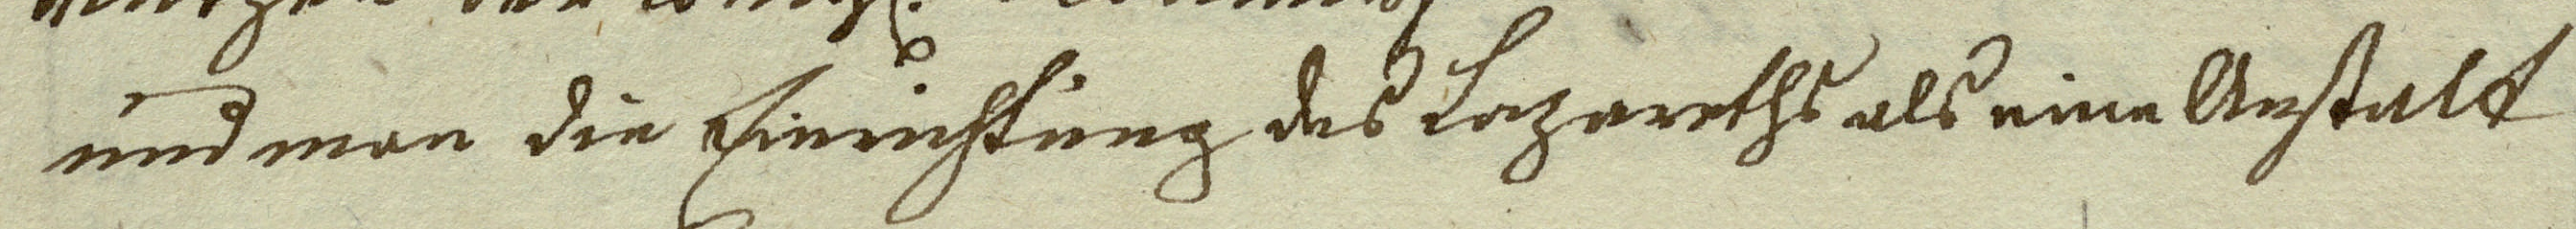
und man die Einrichtung des Lazareths als eine Anstalt
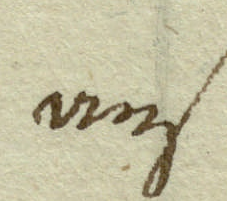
ans
